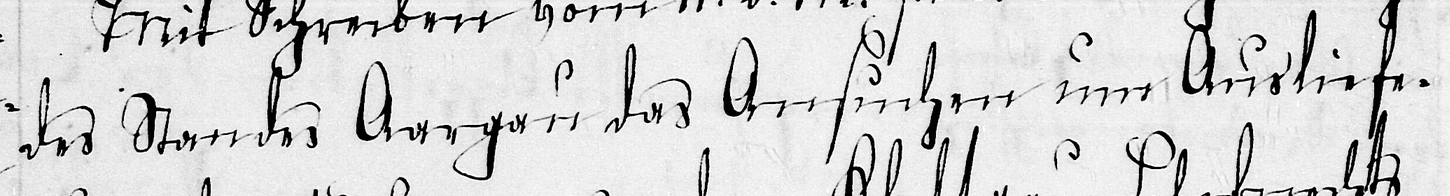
des Standes Aargau das Ansuchen um Ausliefe¬
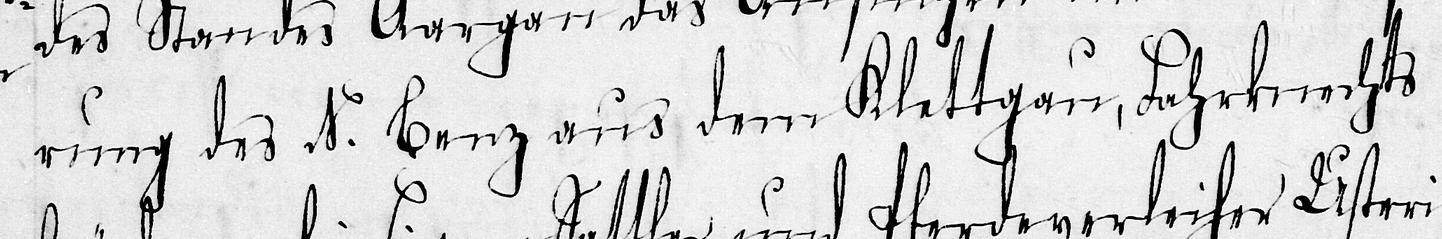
rung des N. Benz aus dem Klettgau, Fahrknechts
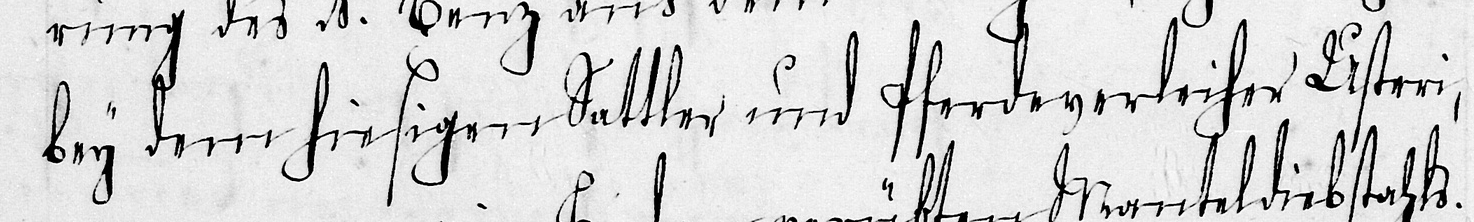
bey dem hiesigen Sattler und Pferdeverleiher Usteri,
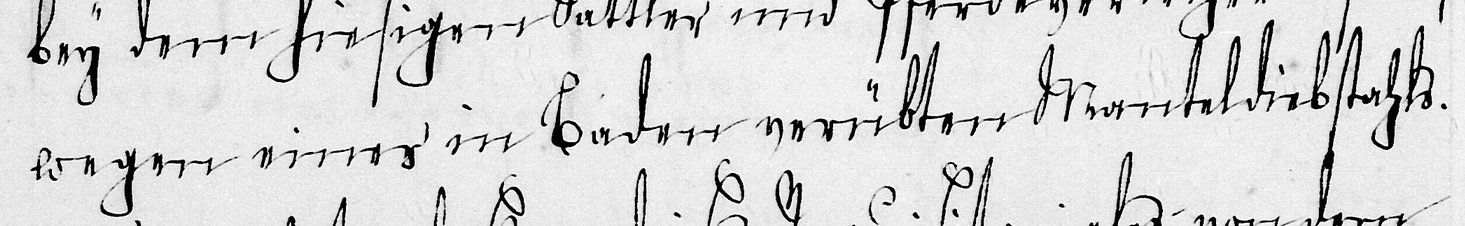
wegen eines in Baden verübten Manteldiebstahls.
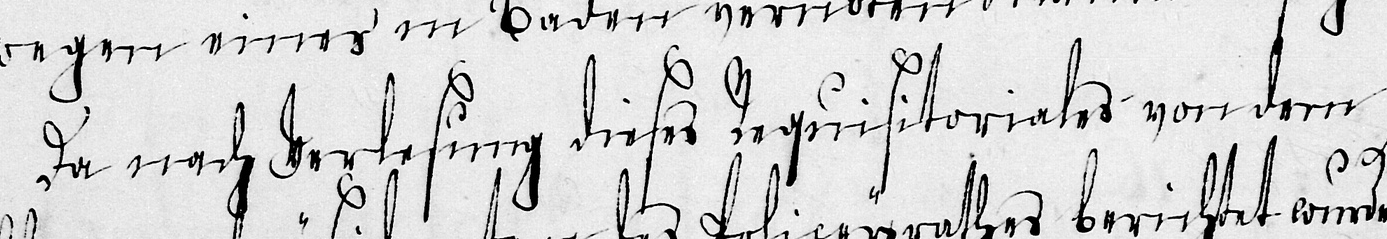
Da nach Verlesung dieses Requisitoriales von dem
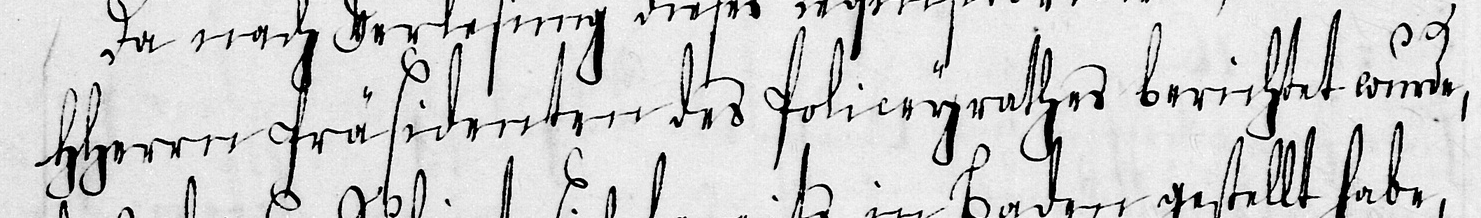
HHerrn Präsidenten des Policeyrathes berichtet wurde,
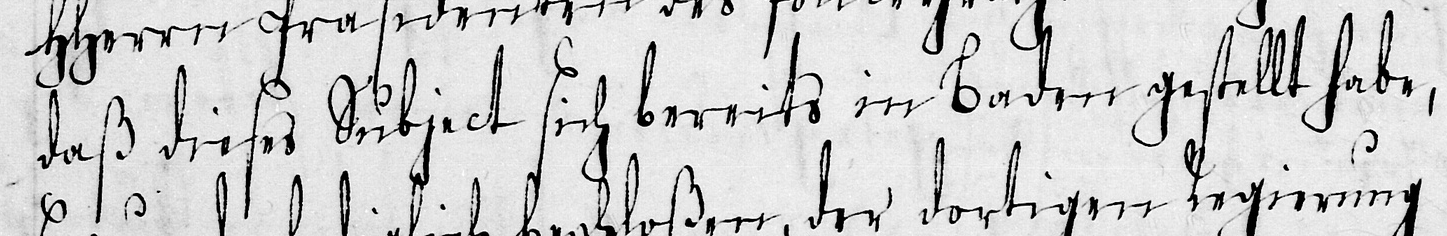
daß dieses Subject sich bereits in Baden gestellt habe,
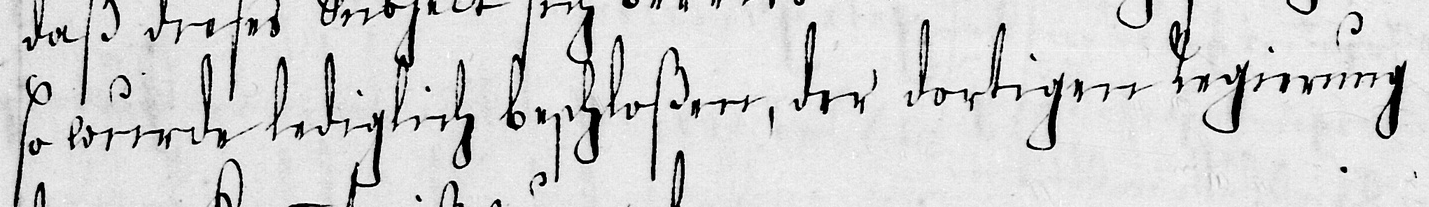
so wurde lediglich beschloßen, der dortigen Regierung
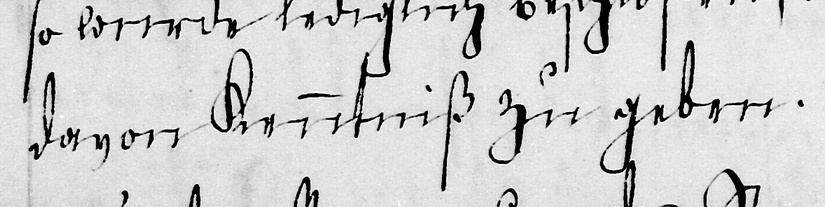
davon Kenntniß zu geben.
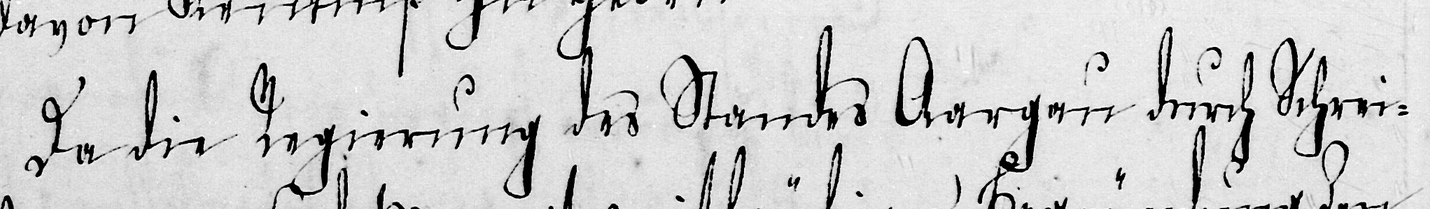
Da die Regierung des Standes Aargau durch Schrei¬
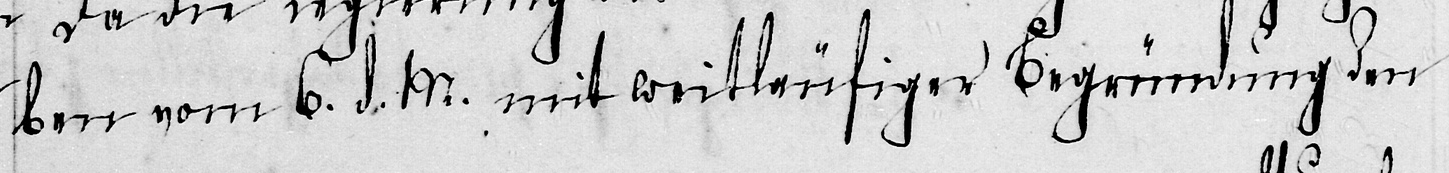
ben vom 6. d. M. mit weitläufiger Begründung den
